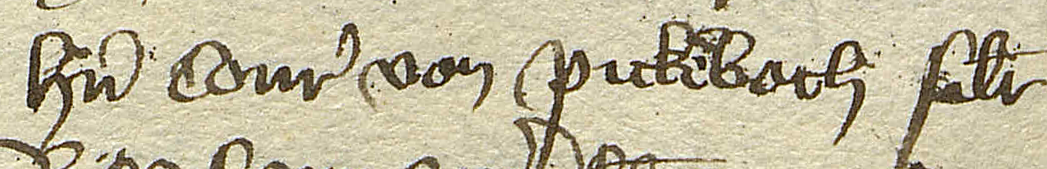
hn* Conr* von Picke*bach ſilr*
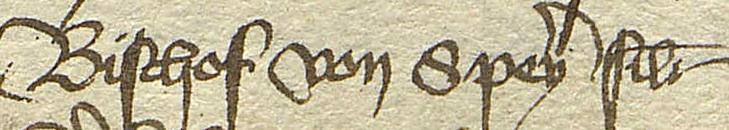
Biſchof von Spey* ſilr*
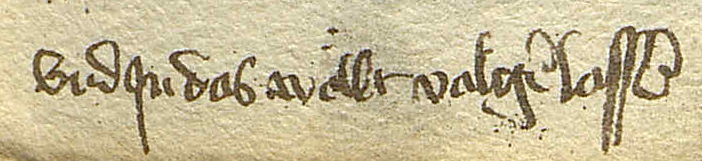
vnd In das wöllt volge* laſſe*
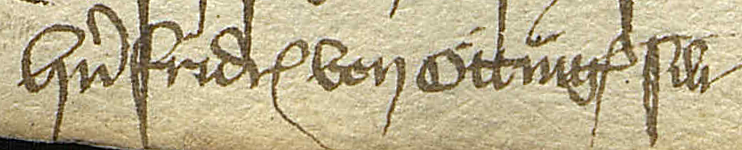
hn* Fridr* von Ötting* ſilr*
